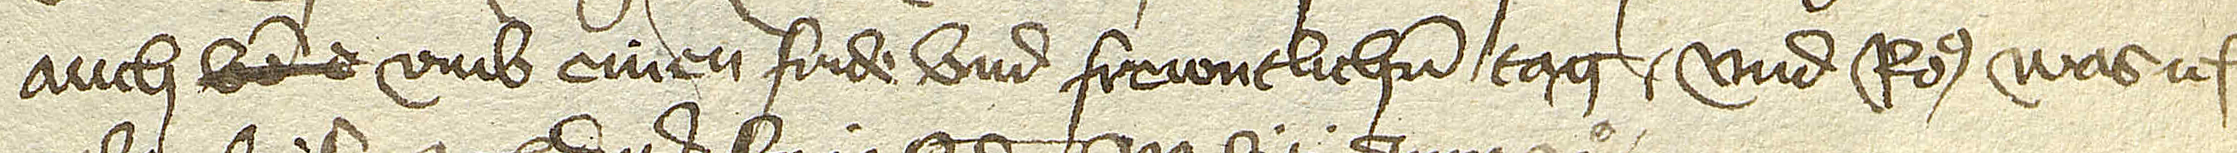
auch vo* e vmb einen fride vnd frewntlichn* tag / vnd Ro* was ec*
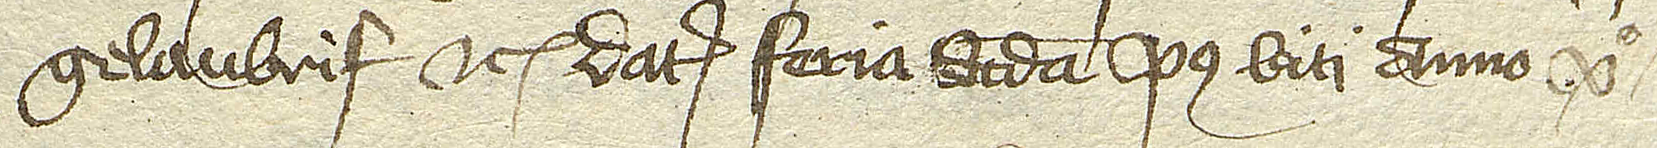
gelaubrif ec* dat* feria Scda* p* viti Anno x* /
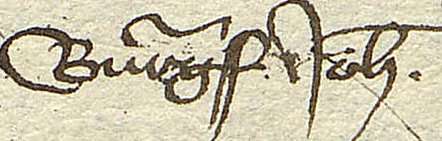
Burg*f Ioh* .
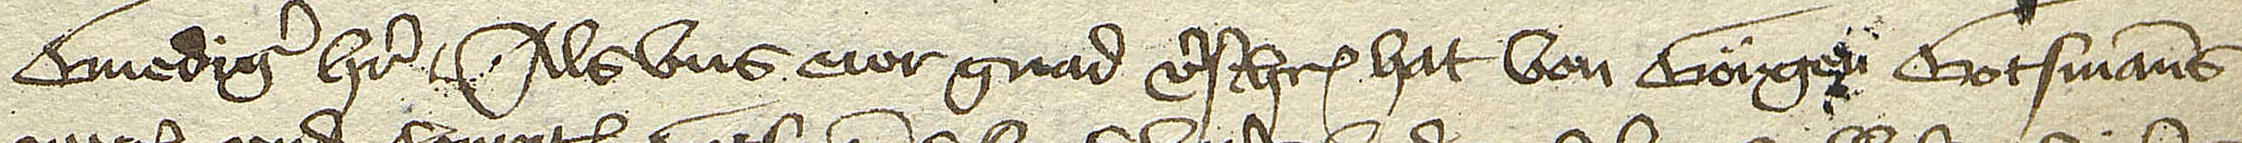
Gnedig* hr* / Als vns ewr gnad v*ſchr* hat von Görgen Gotſmans*
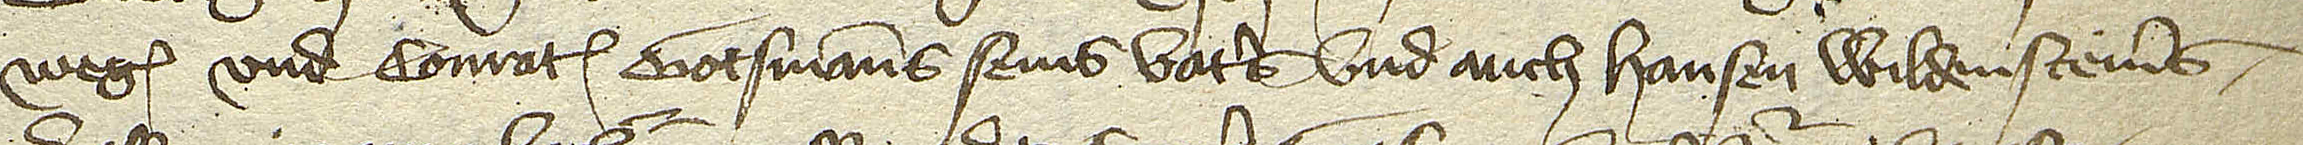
weg* vnd Conrat* Gotſmans* ſeins vat*s vnd auch hanſen Wildenſtein*s /
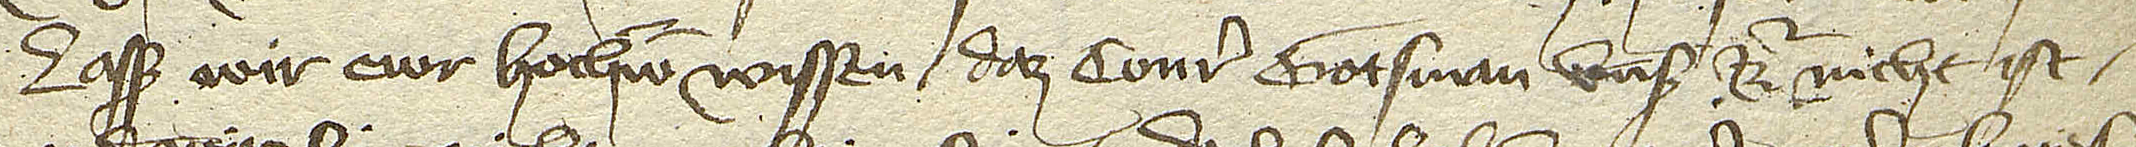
Laſſ* wir ewr hochw* wiſſen / daʒ Conr* Gotſman vnſ* B* nicht iſt /
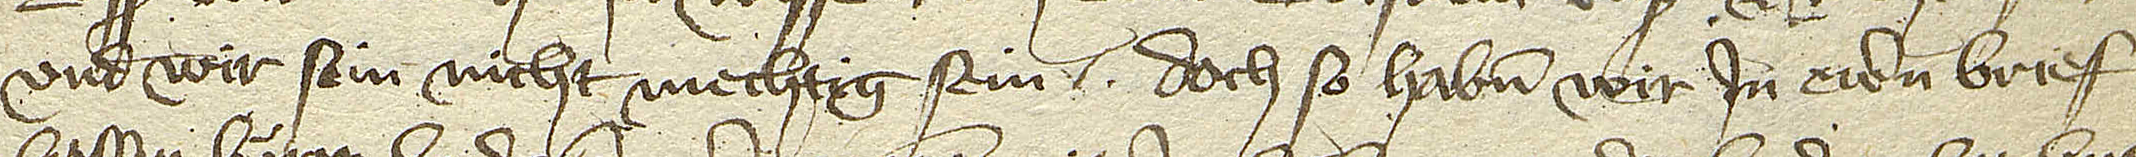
vnd wir ſein nicht mechtig ſein / . doch ſo habn* wir In ew*n brief
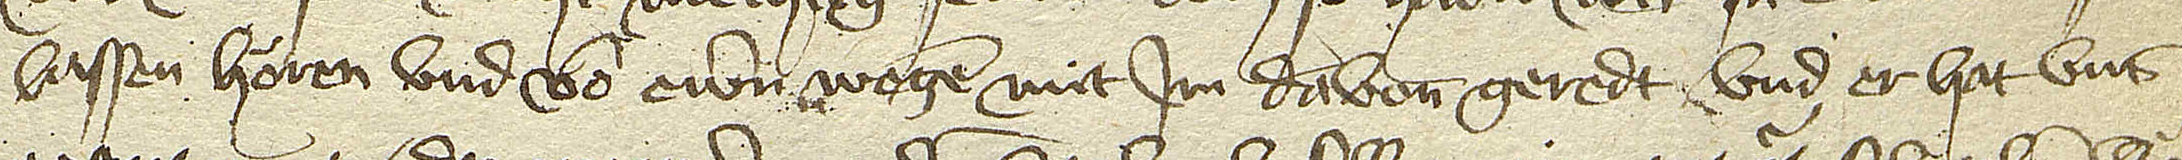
laſſen hören vnd vo* ewn* wege* mit Im davon geredt / vnd er hat vns
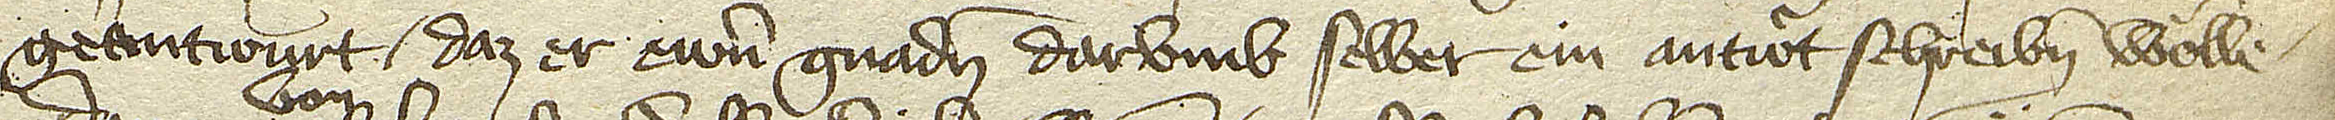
geantwurt / daʒ er ewn* gnadn* darvmb ſelber ein antwt* ſchreibn* wölle /
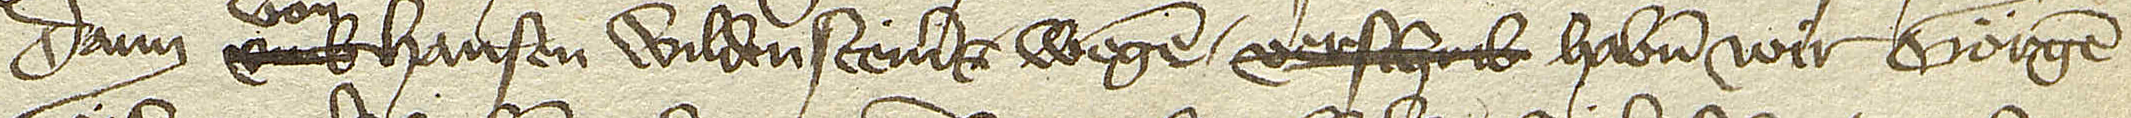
Dann vmb hanſen Wildenſten*s wege* / verſchrib habn* wir Görge*
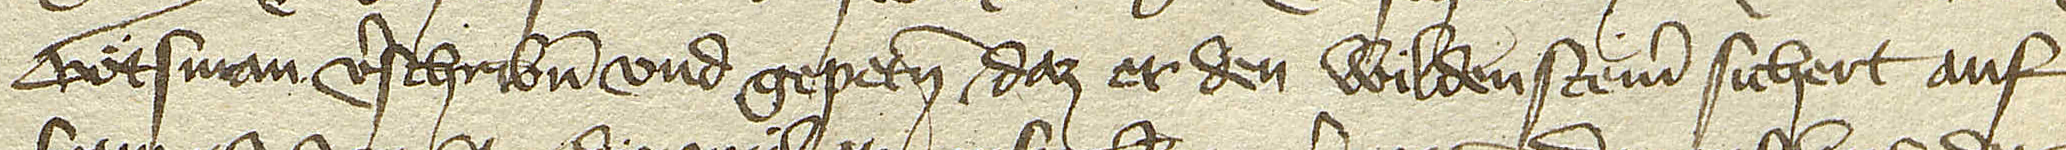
Götſman v*ſchribn* vnd gepetn* / daʒ er den Wildenſtein* ſichert auf
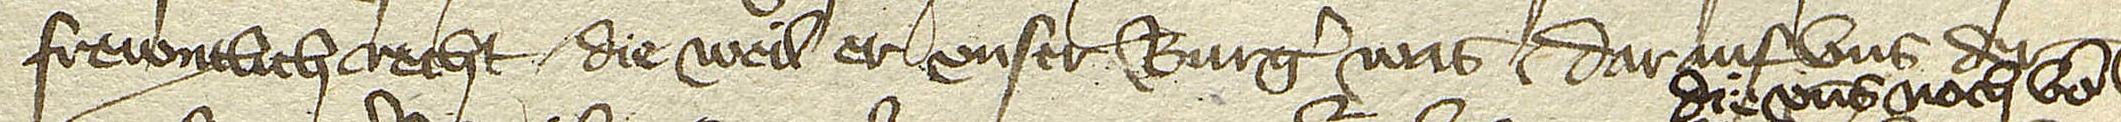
frewntlich recht / die weil er vnſer Burg* was / darauf vns der
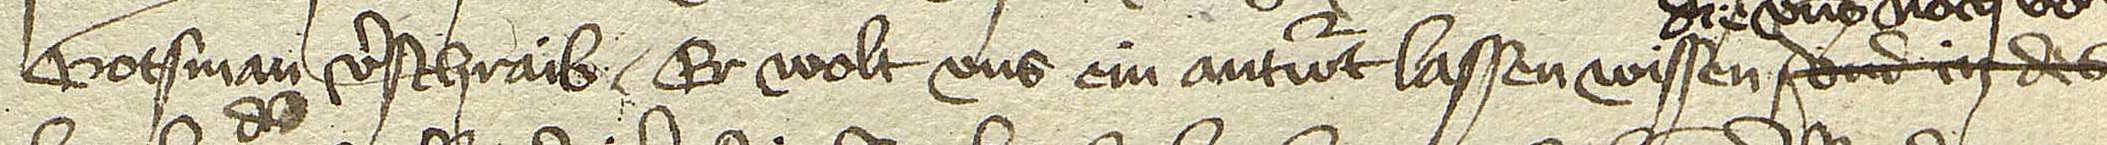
Gotſman v*ſchraib / Er wolt vns ein antwt* laſſen wiſſen vnd in des
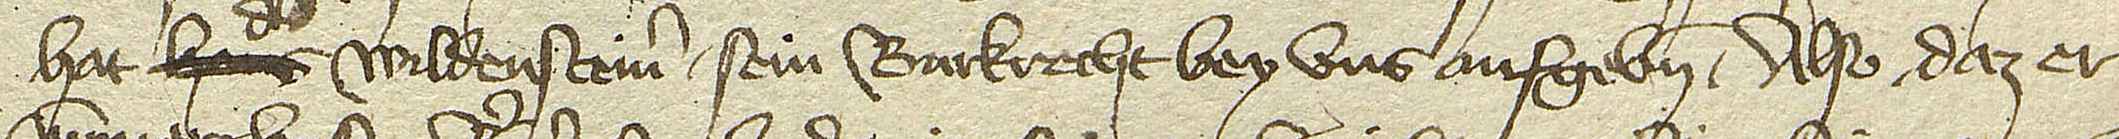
hat hans wildenſtein* / ſein Burkrecht bey vns aufgebn* / Alſo / daʒ er
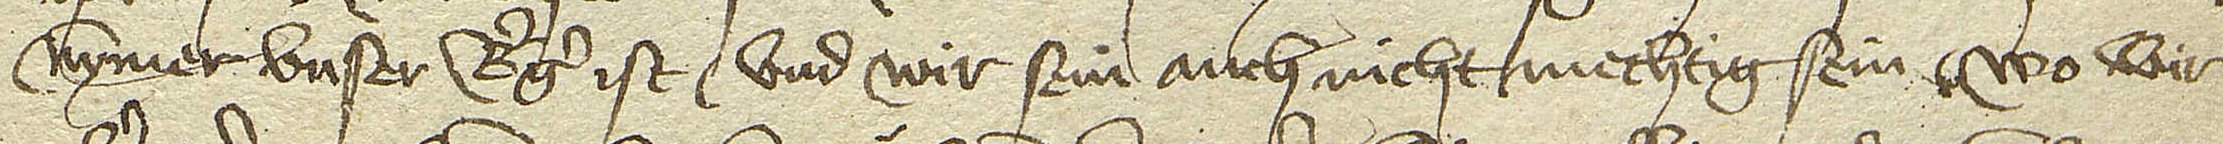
Nym*er vnſer B*g* iſt / vnd wir ſein auch nicht mechtig ſein / wo wir
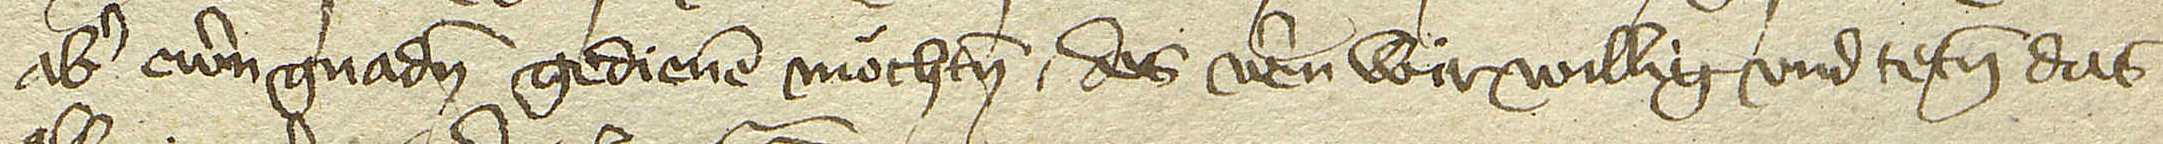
ab* ewn* gnadn* gediene* möchtn* / des we*n wir willig vnd tetn* das
